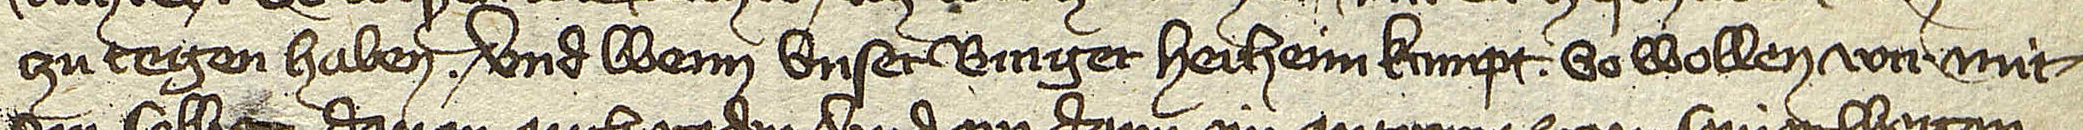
cʒu tegen haben . / Vnd wenn vnſer Burger herheim kumpt . So wollen wir mit
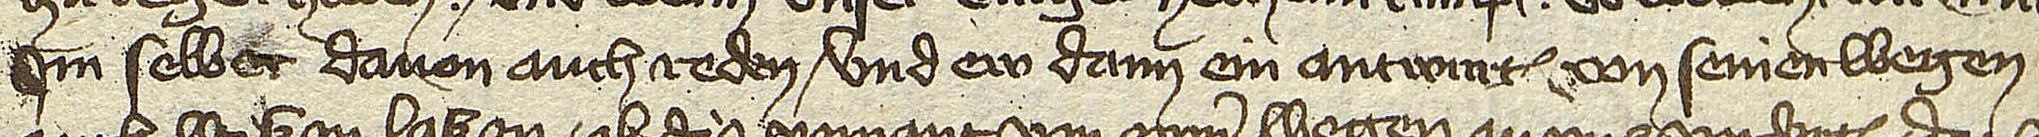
Im ſelber dauon auch reden / vnd ew dann ein antwurt von ſeinen wegen
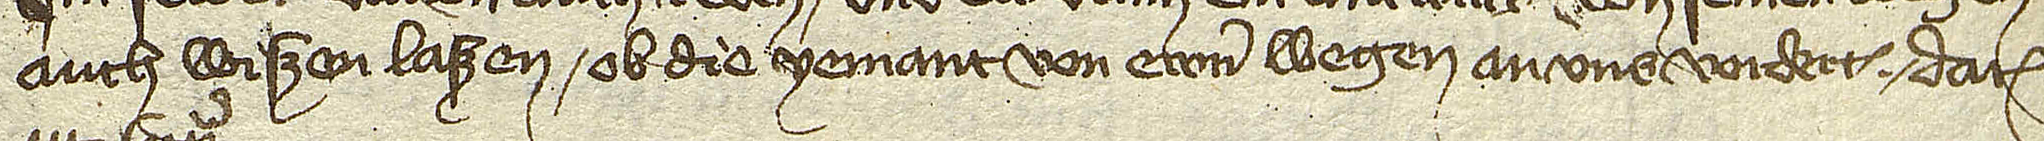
auch wiſʒen laſʒen / ob die yemant von ewn* wegen an vns wiedert* . dat*
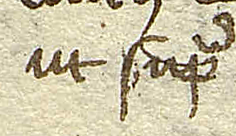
ut ſup*
